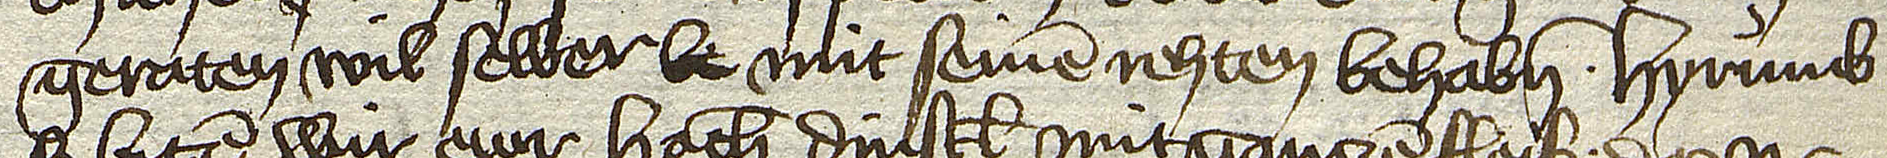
geraten wil ſelber be mit ſeine* rehten behab*n . Hyrümb
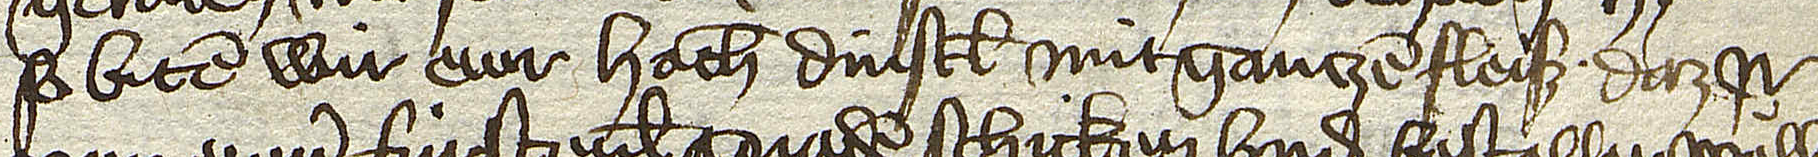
ſo bite* wir ewr hoch* dinſtl* mit gancʒe* fleiſʒ . daʒ Ir
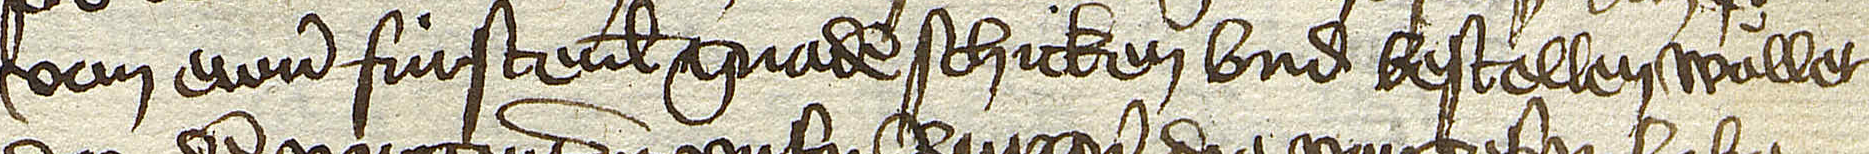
von ew*n fürſtenl* gnade* ſchicken vnd beſtellen wöllet
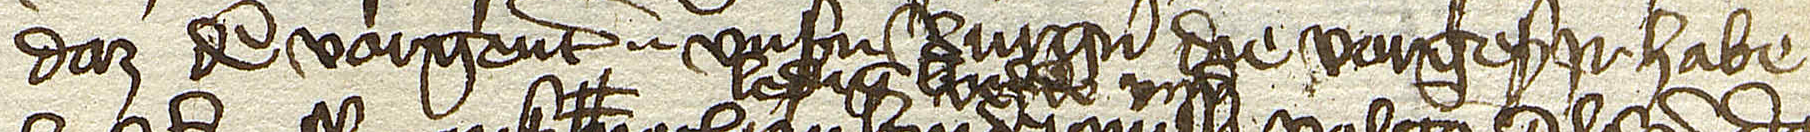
daʒ de* vorgen*t ~ vnſ*n Burg*n die vorgeſ* Ir habe
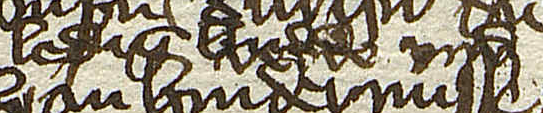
ledig werde vnd
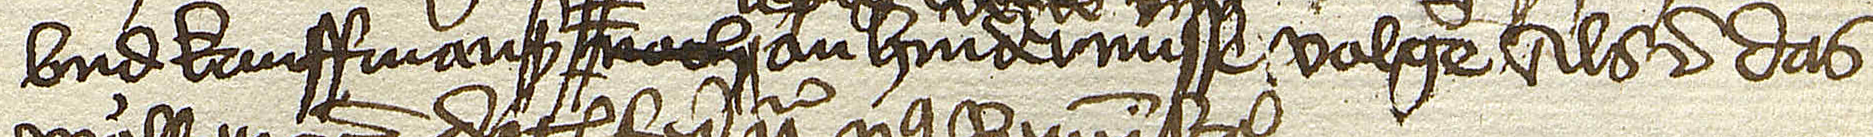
vnd kauffmanſ* noch on hindernüſſe volge Als ec* das
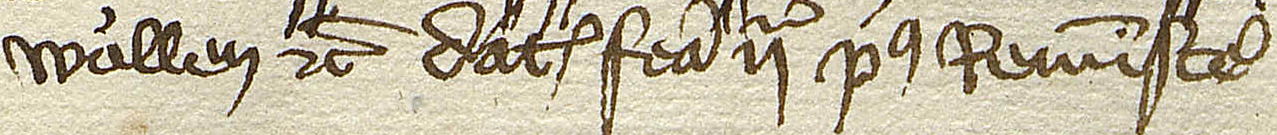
wöllen ec* dat* fia* ii* p* Remi*ſce*
